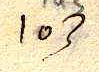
103
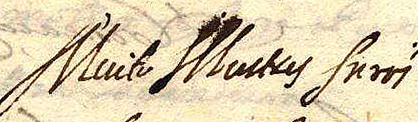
Muito Illustres snres̄
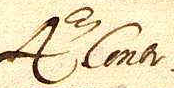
4as Contr.
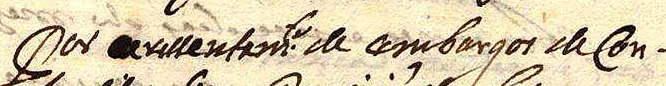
Por acressentam.to de embargos de Con
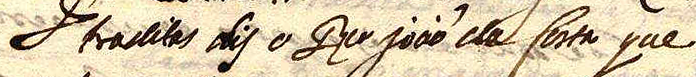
traditas dis o Reo Joaõ da Costa que
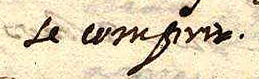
se comprir.
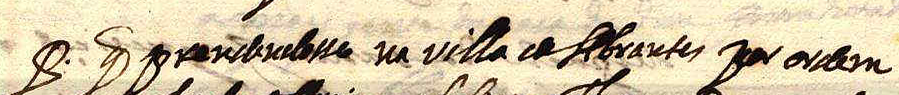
P. q̄ prendendosse na villa de Abrantes por ordem
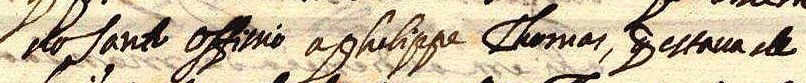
do Santo Offissio a phelippe Thomas, q̄ estaua de
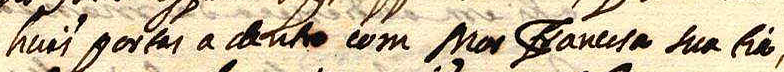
huās portas adentro com Mor Francesa sua tia,
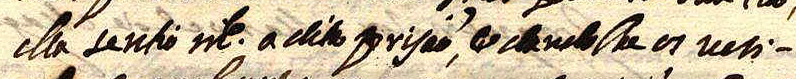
ella sentio m.to a dita prisaõ, e dandolhe os uesi
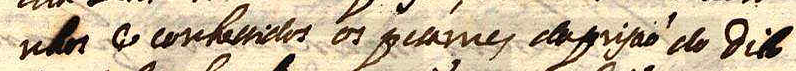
nhos e conhecidos os pesames da prisaõ do dito
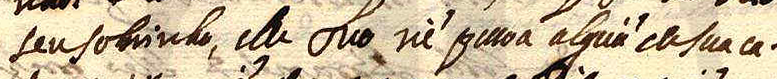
seu sobrinho, elle Reo nē pessoa alguā de sua ca
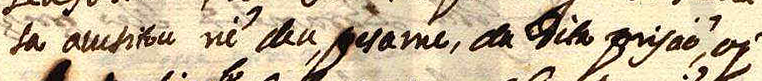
sa a uesitou nē deu, pesame, da dita prisaõ, o q̄
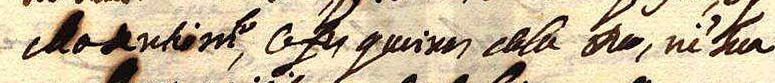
ella sentio mto, e fes queixas delle Reo, nē sua
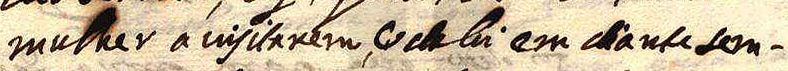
mulher a uisitarem, e dahi em diante sem
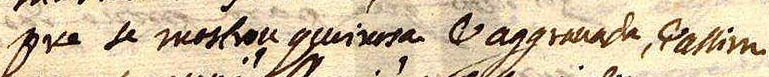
pre se mostrou queixosa e aggrauada, e assim
